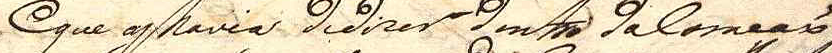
E que as havia de dizer dentro da Coraçaõ
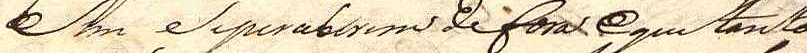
Sem Se perceberem de fora E que tanto
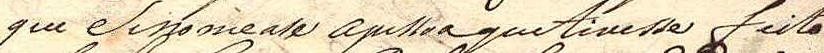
que Se nomease a pessoa que tivesse feito
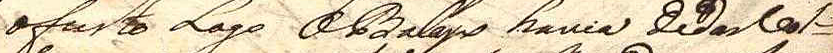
o furto Logo O Balayo havia de dar vol
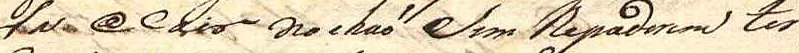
ta e cair no chaõ Sem lhe poderem ter
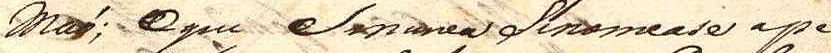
maõ; E que se nunca se nomease a pe
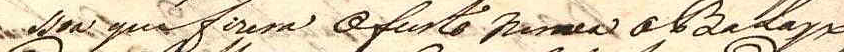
ssoa que fizera o furto numca o BaLayo
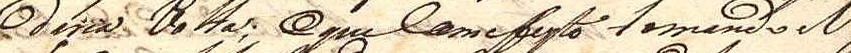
daria Volta; E que Com effeyto tomando el
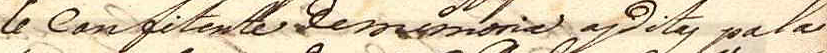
le Confitente de memoria as ditas pala
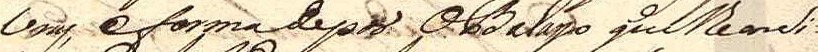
vras, e forma de por O BaLayo que lhe ensi
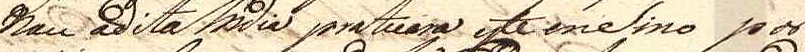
nou a dita India praticara este ensino por
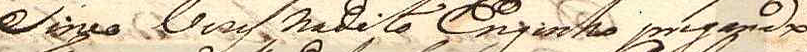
sinco Uezes no dito Engenho pregando
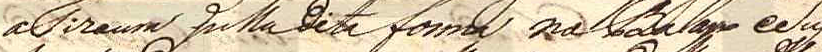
a Tizoura pella dita forma no Balayo e sus
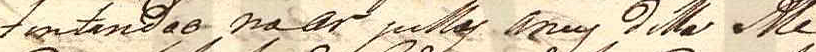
tentando o no ar pellos aneis della elle
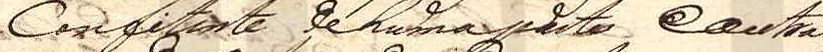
Confitente de huma parte E outra
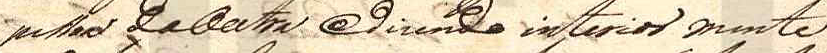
pessoa da outra E dizendo interiormente
